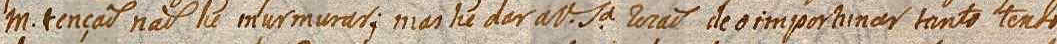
m. tençaõ naõ hé murmurar; mas hé dar a V. S.a Rezaõ de o importunar tanto tendo
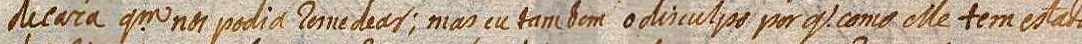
de caza q.m nos podia remedear; mas eu tambem o disculpo porq̄. como elle tem estado
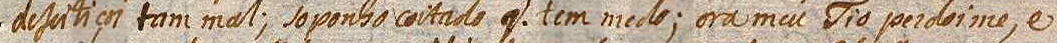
de feitiços tam mal; soponho coitado q̄. tem medo; ora meu Tio perdoime, e
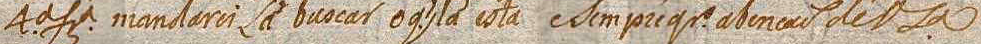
4.a f.a mandarei Lá buscar o q̄. lá esta e sempre qr.o a bencaõ de V. S.a
